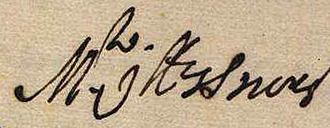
M.to jlles snors̄
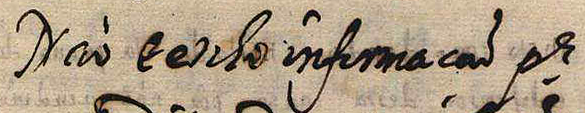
Naõ tenho informaçaõ p.a
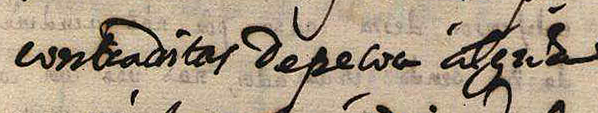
contraditas de peçoa alguā
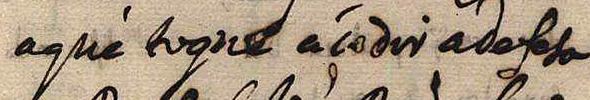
a quē toque acodir a defesa
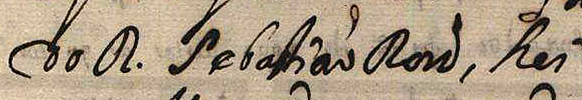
do R. Sebastiaõ Roiz̄, hei
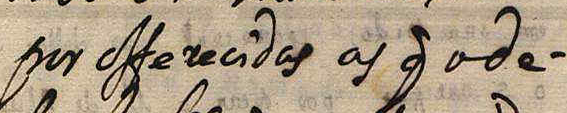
por offerecidas as q̄ o de
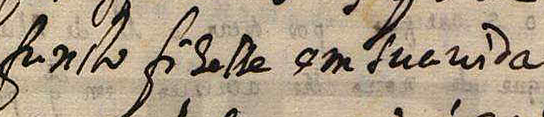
functo fizesse em sua uida
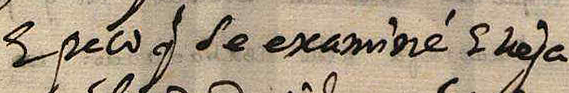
E peço q̄ se examinē E ueja
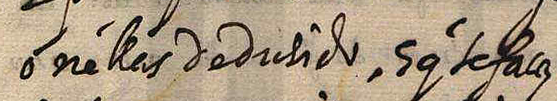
o nellas dedusido, E q̄ se faça
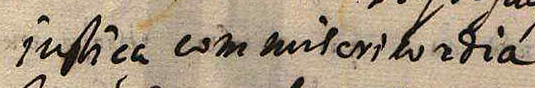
iustiça com misericordia
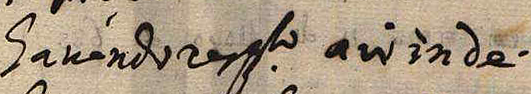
hauendo resp.to a ir inde
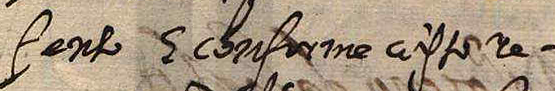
fenso E conforme a isso re
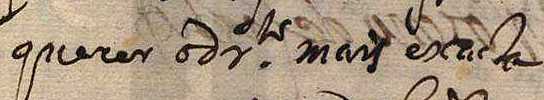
querer o dr.to mais exacta
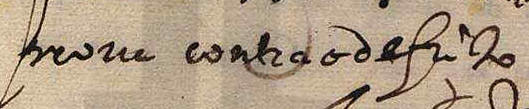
proua contra o defeito
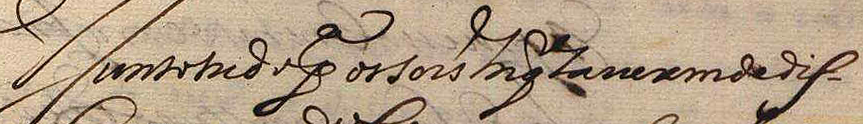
E Junto tudo pa os sors̄ Inqres auerem de dis
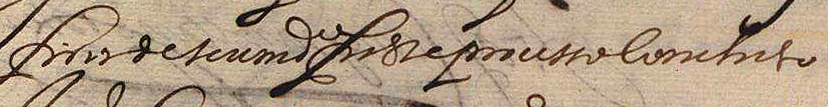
firir de seu mdo fis este processo concluso
